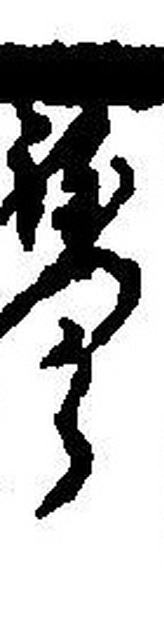ねつから
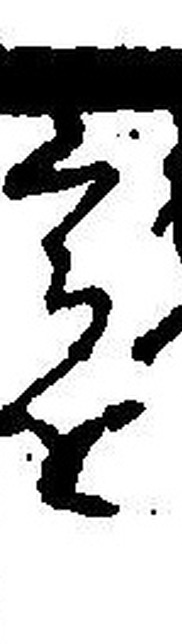くちを
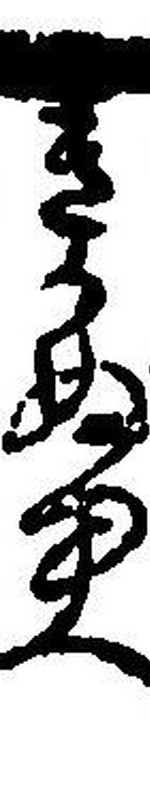きかぬゆへ
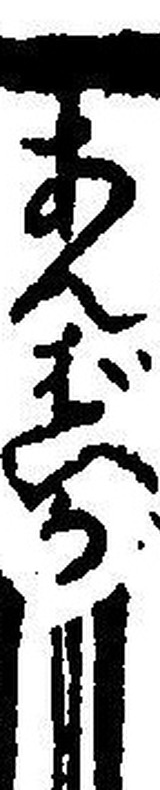あんばいが
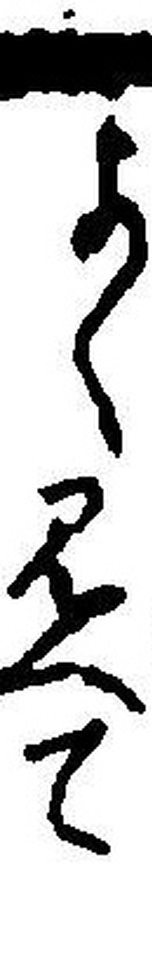よく見へて
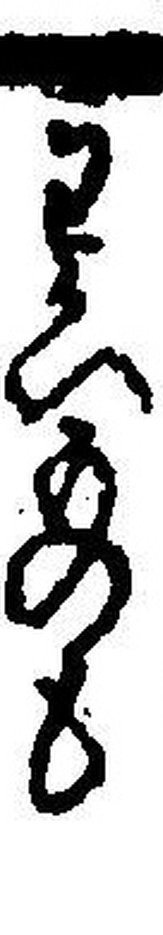わかいものも
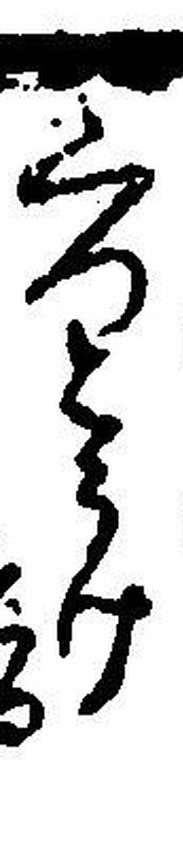くつとうけ

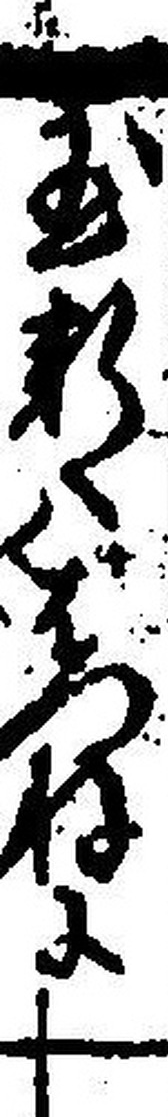玉新ははつねに
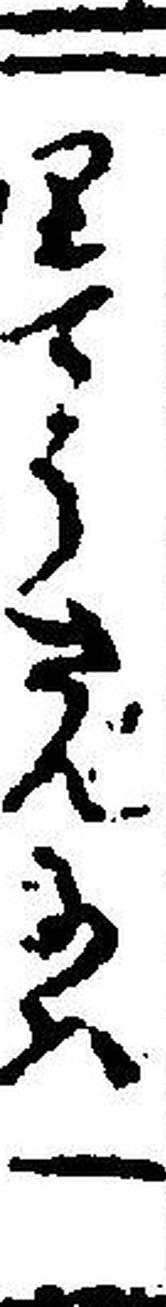りてうさんには
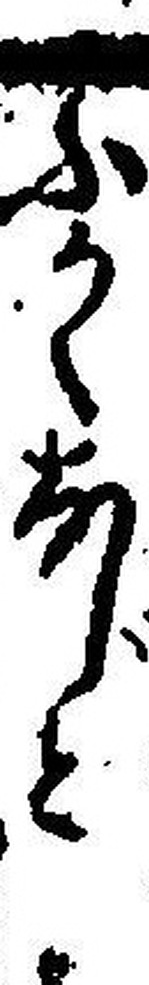ふかくなじと
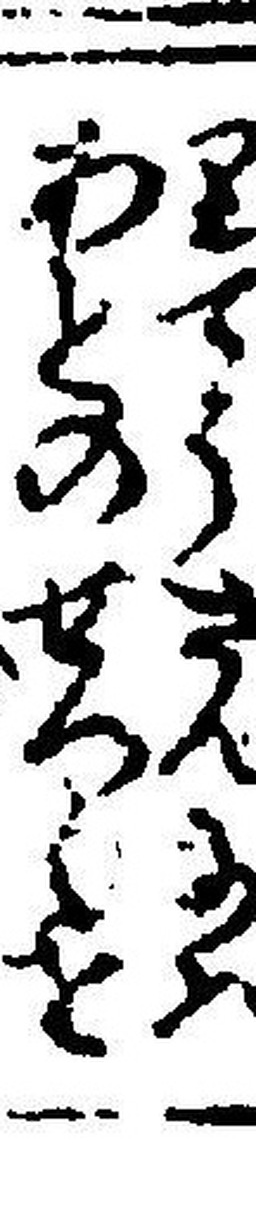あとのせつくを
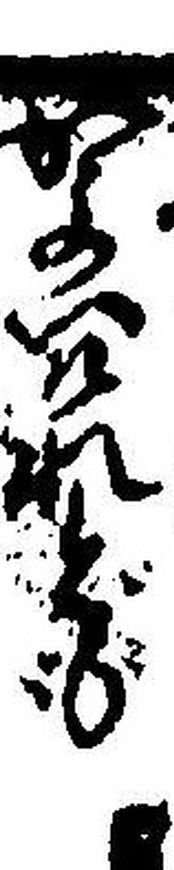かよいけれども
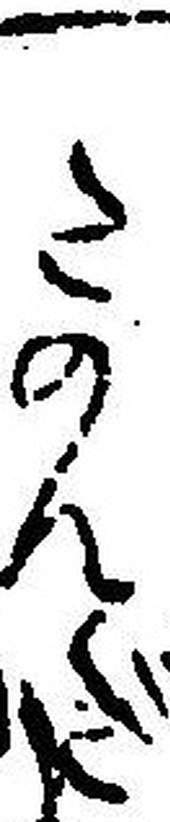たのんだ
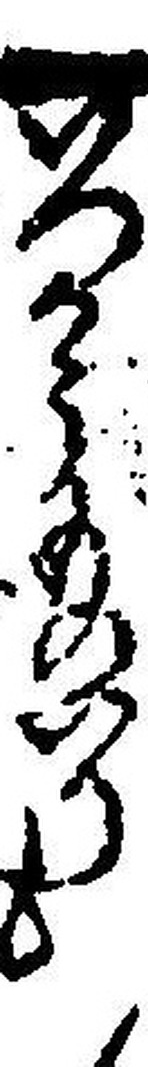いつかうものいりも
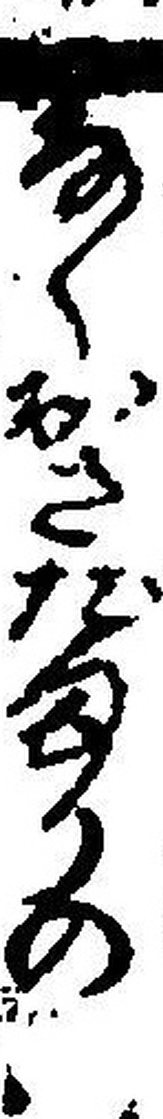なくおさだまりの
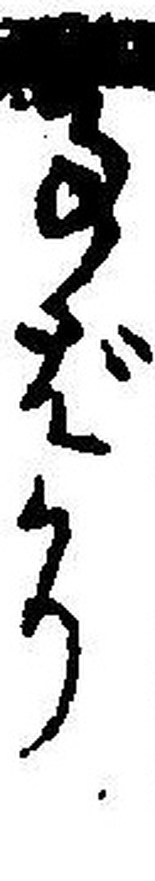事ばかり
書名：間違狐之女郎買 / 市場通笑作
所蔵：東京大学総合図書館 General Library in the University of Tokyo, JAPAN
